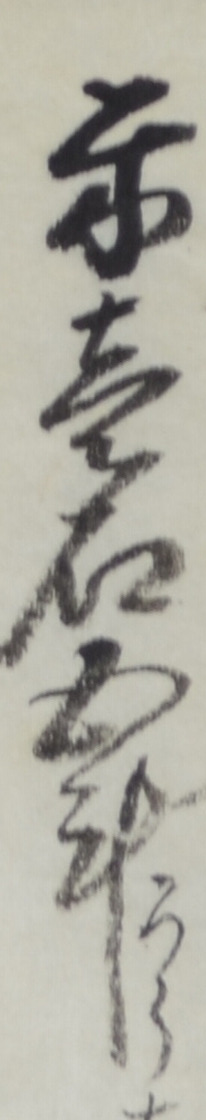米九石九斗
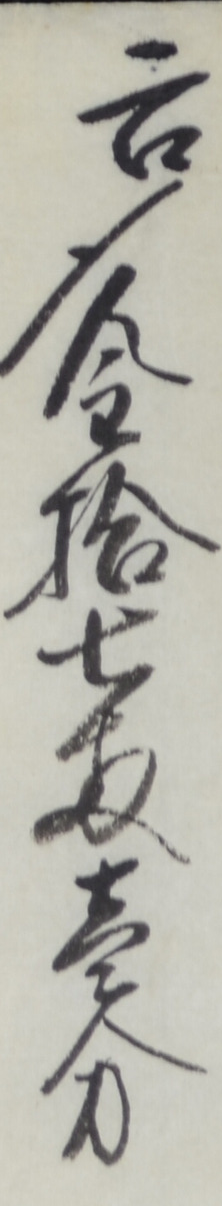二口〆金拾七両壱分
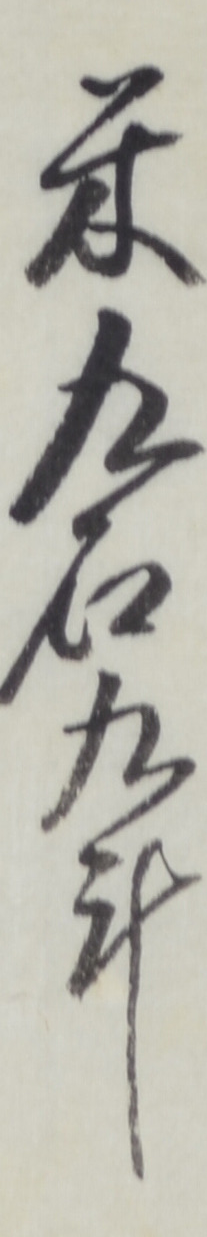米九石九斗
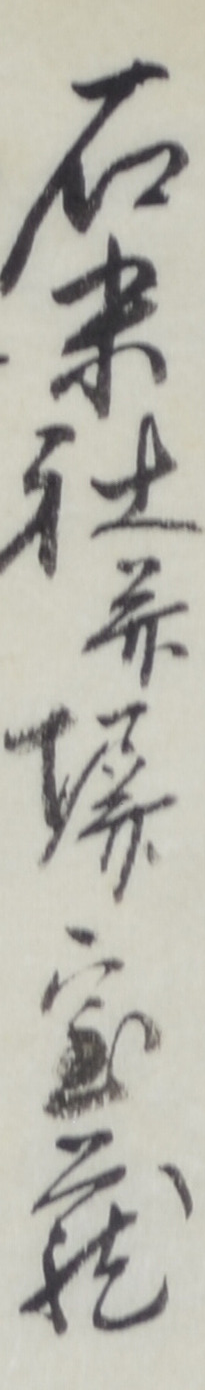右末社并塀宝蔵
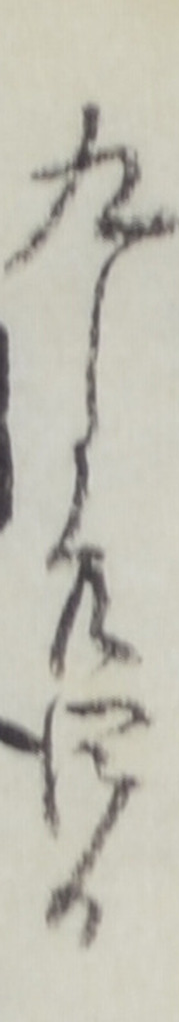九月廿四日
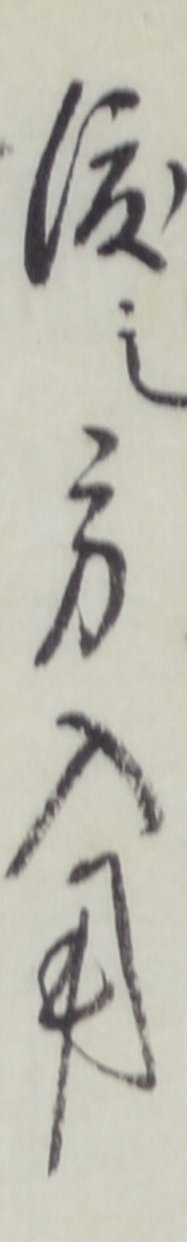渡シ方入用
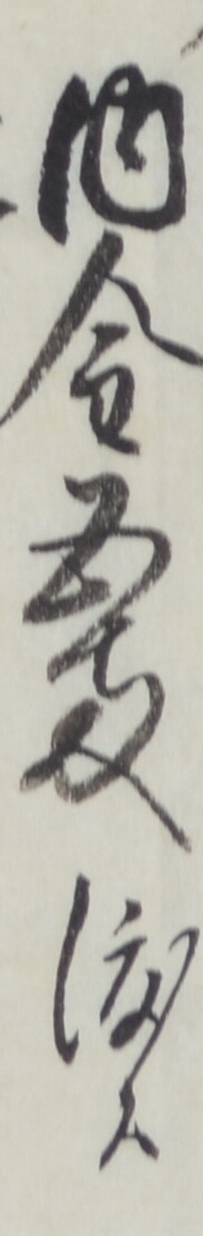内金五両渡ス
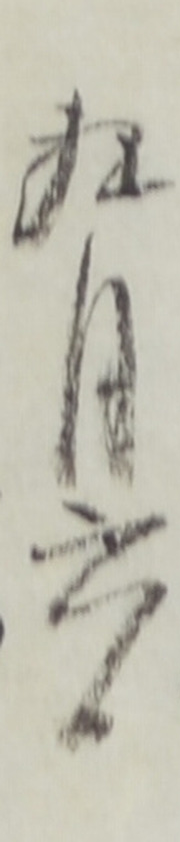拾月六日
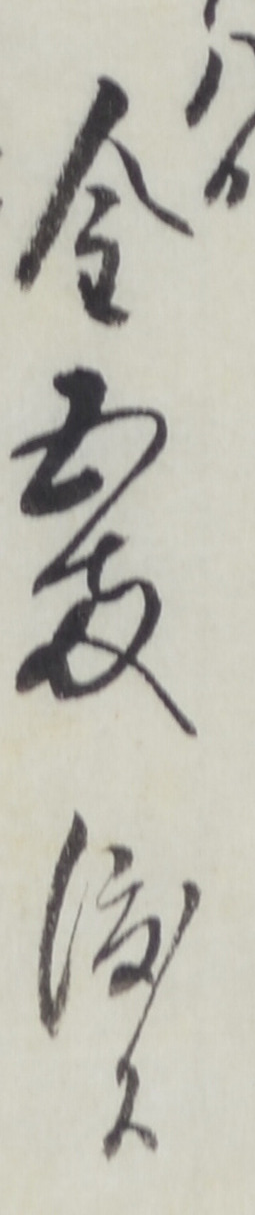金五両渡ス
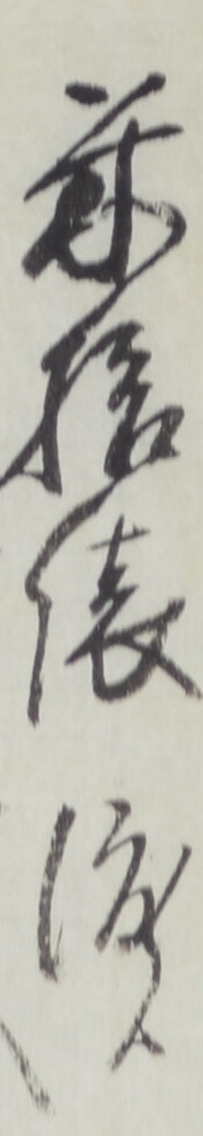米拾俵渡ス
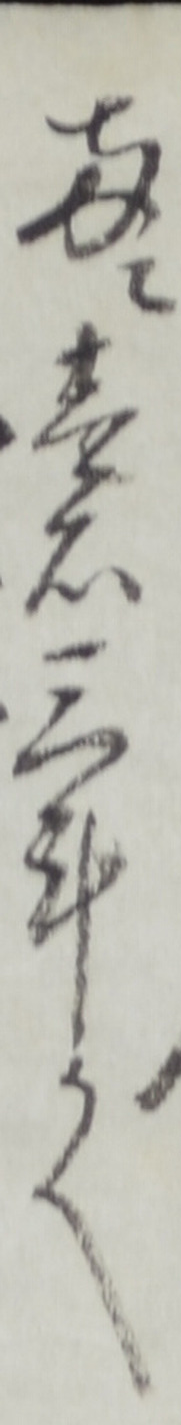両ニ壱石三斗文
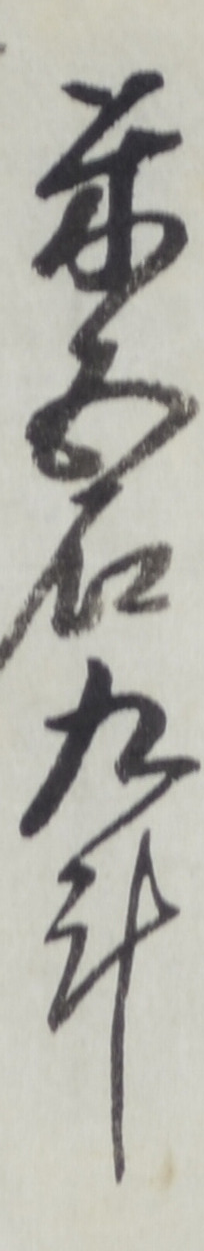米五石九斗
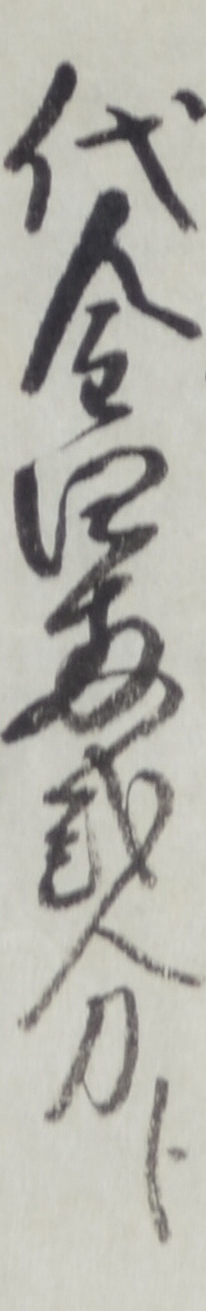代金四両弐分ト
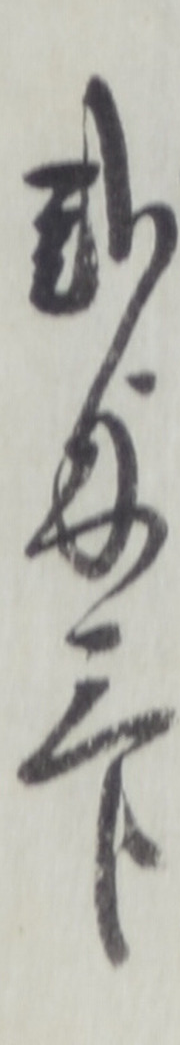弐匁三分
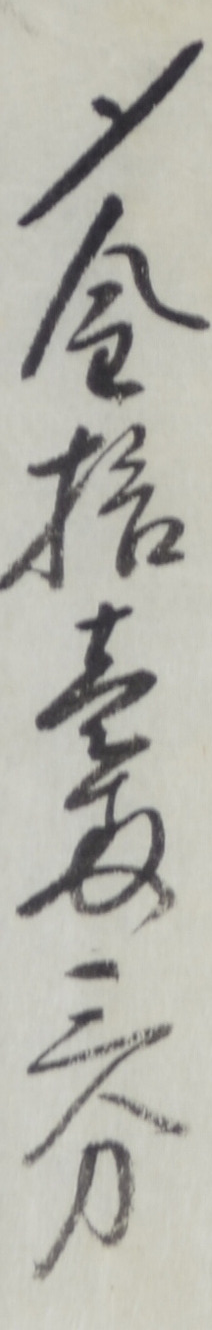〆金拾壱両三分
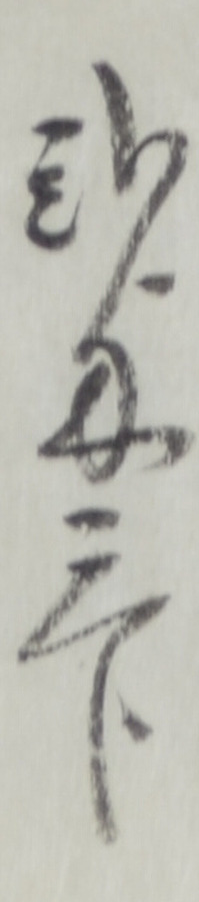弐匁三分
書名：権現分拂方
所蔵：伊那市立高遠町図書館・合同会社AMANE
